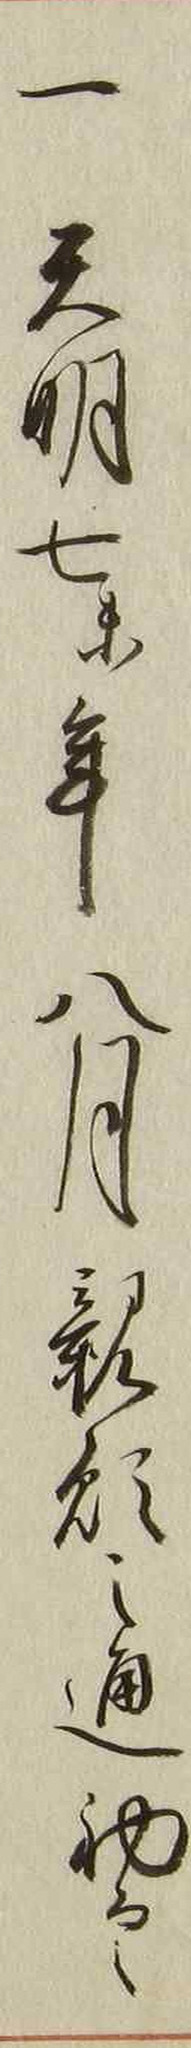一天明七未年八月親願之通初而之
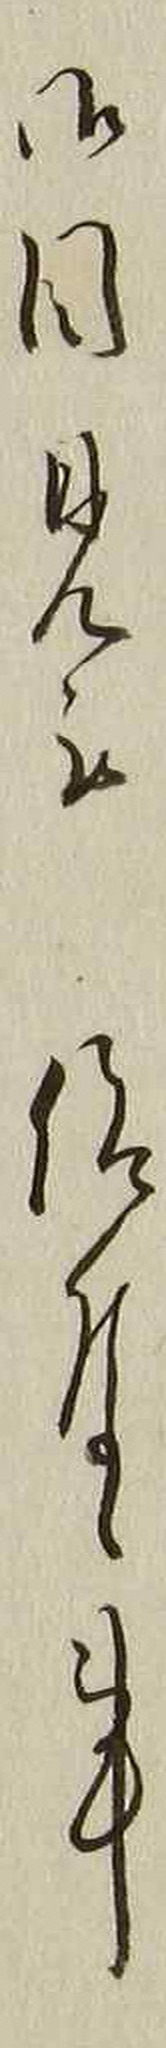御目見被仰付候事
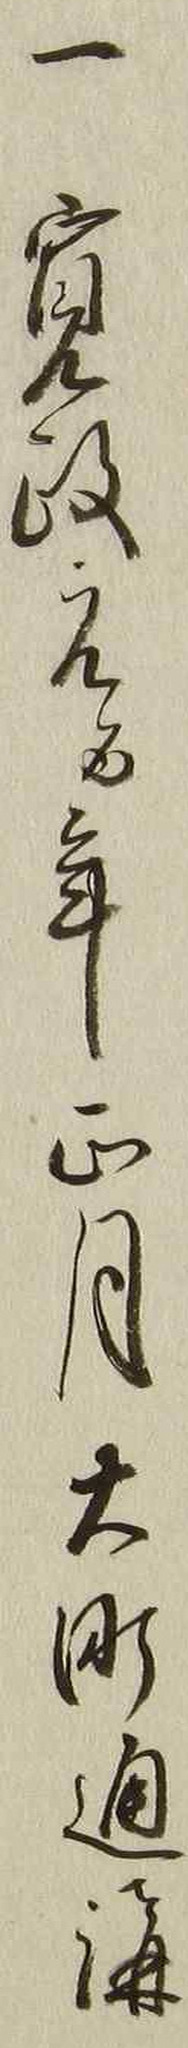一寛政元酉年正月大町通り講
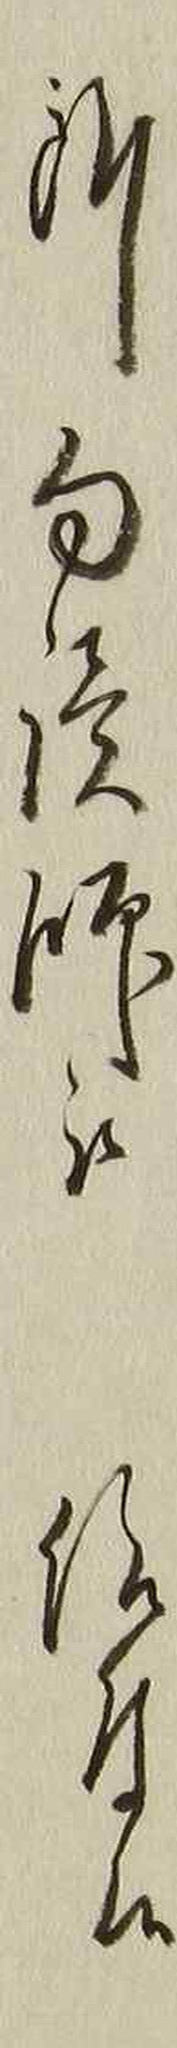所句読師被仰付候
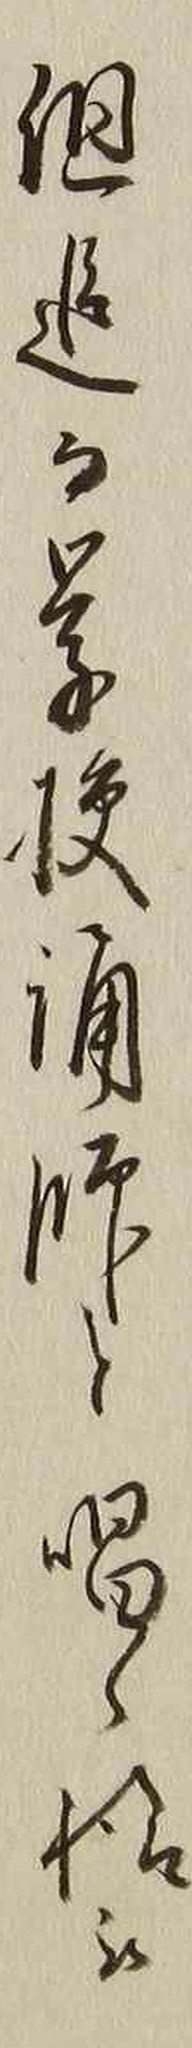但追而学校誦師と唱候様被
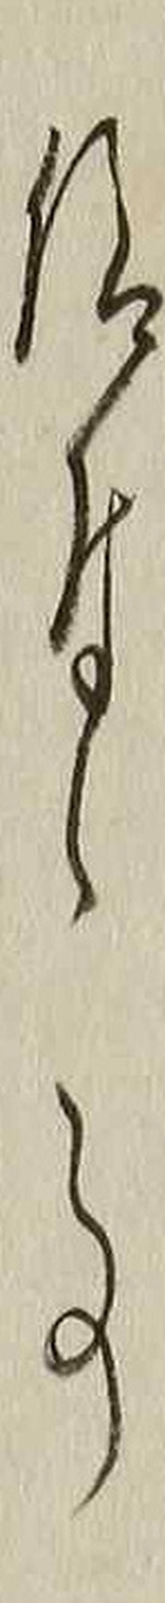仰付候事
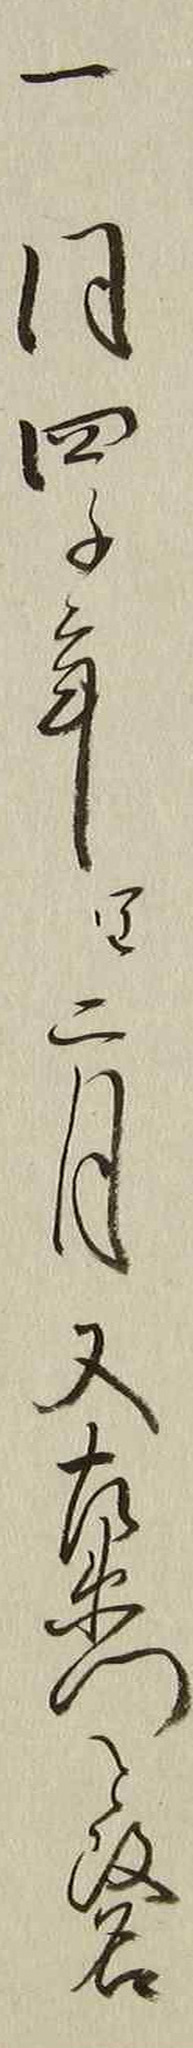一同四子年閏二月又左衛門と改名
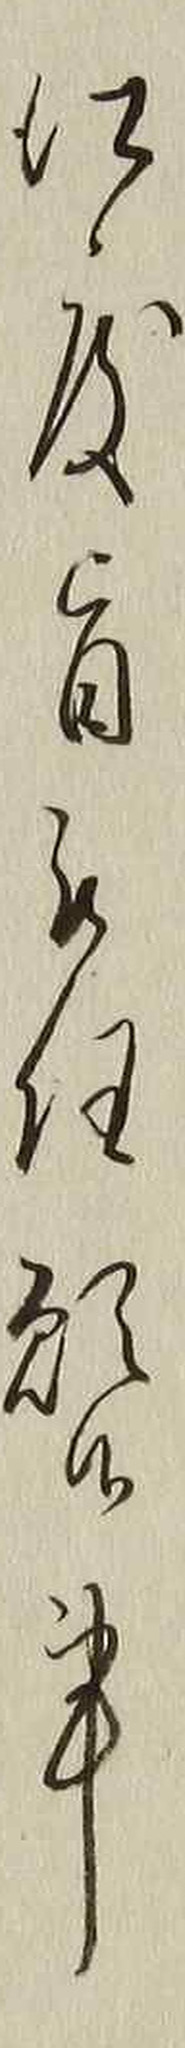仕度旨被任願候事
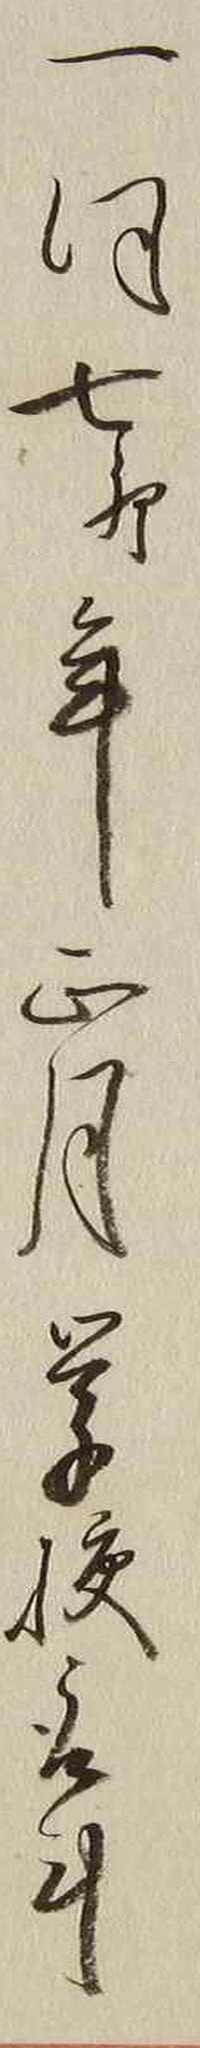一同七卯年正月学校取計
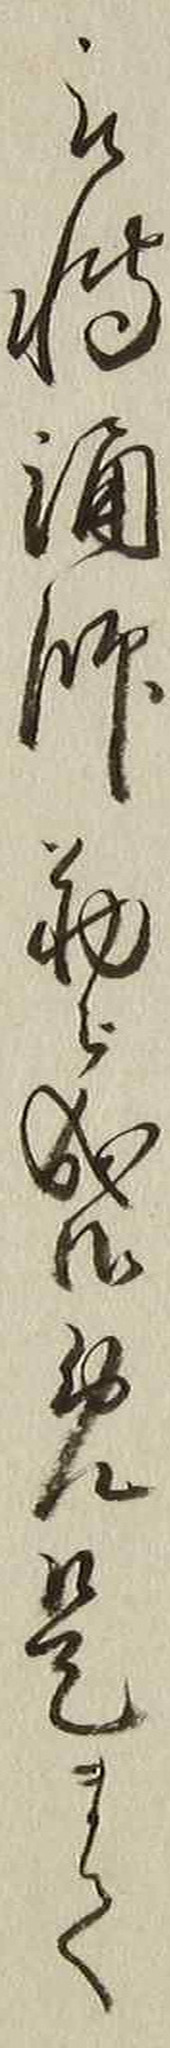被転誦師勤被成御免是まて
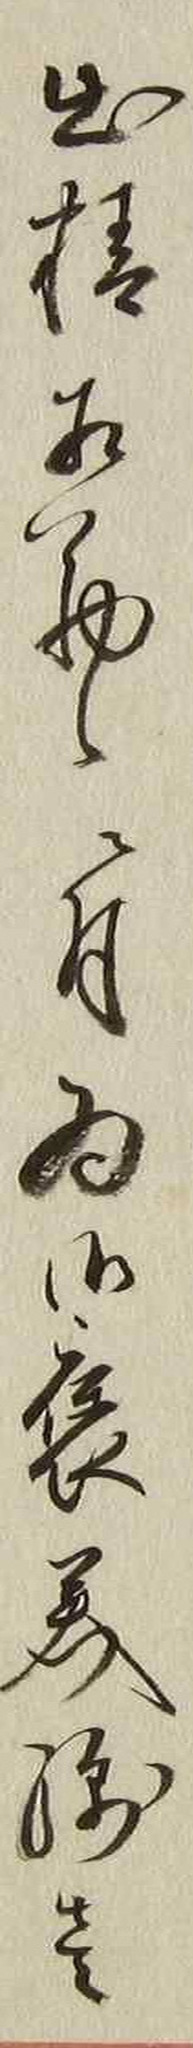出精相勤候ニ付為御褒美綿壱
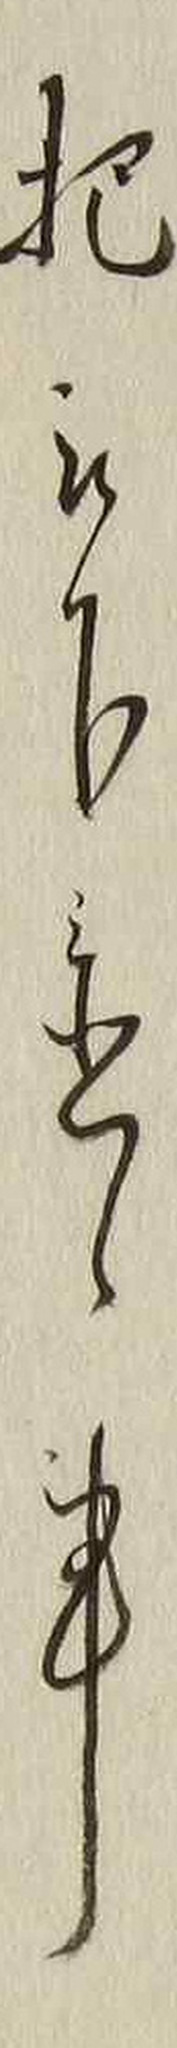把被下置候事
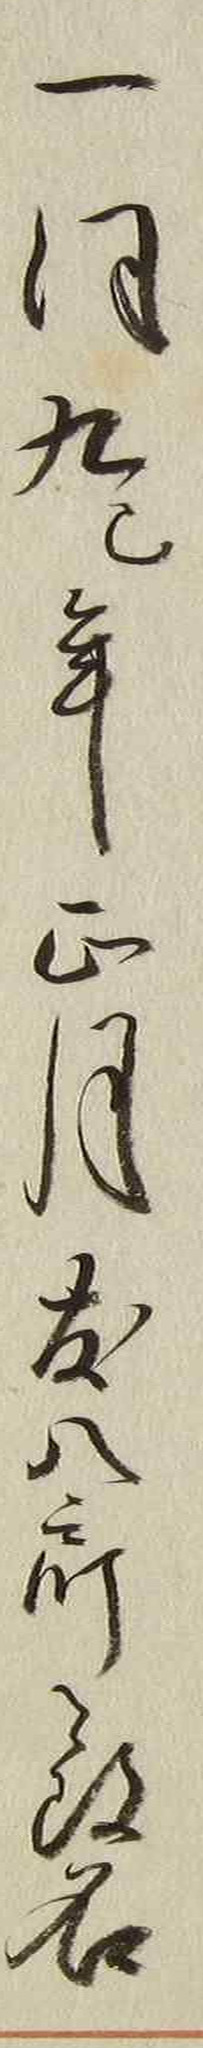一同九巳年正月友八郎と改名
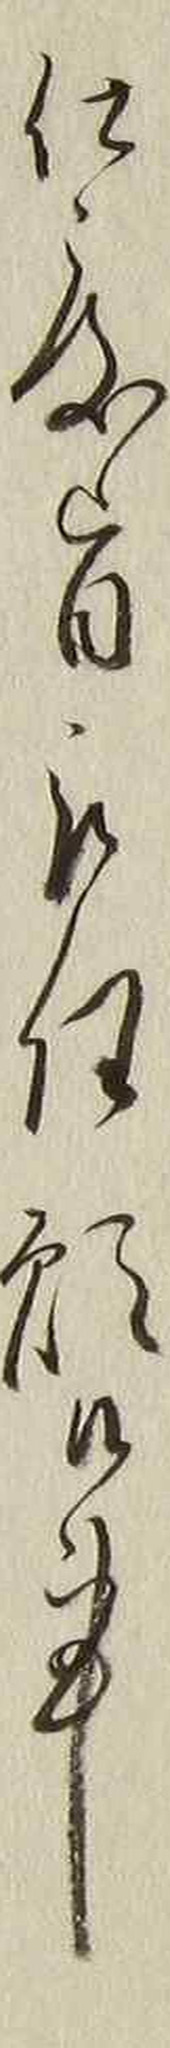仕度旨被任願候事
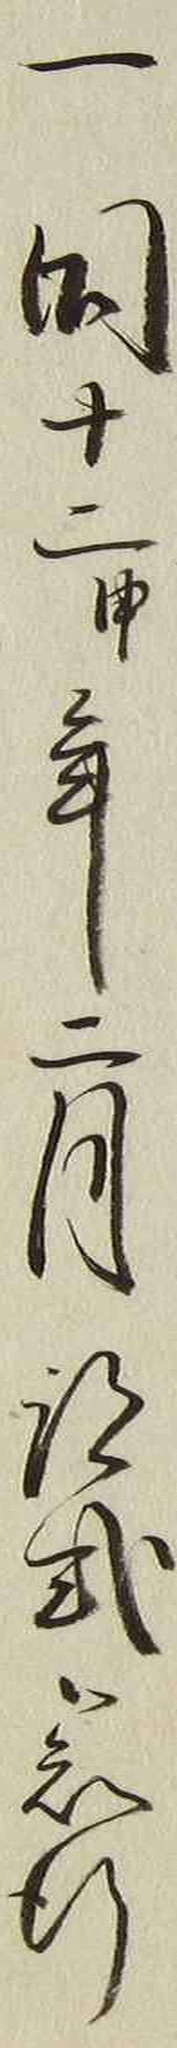一同十二申年二月跡式御知行
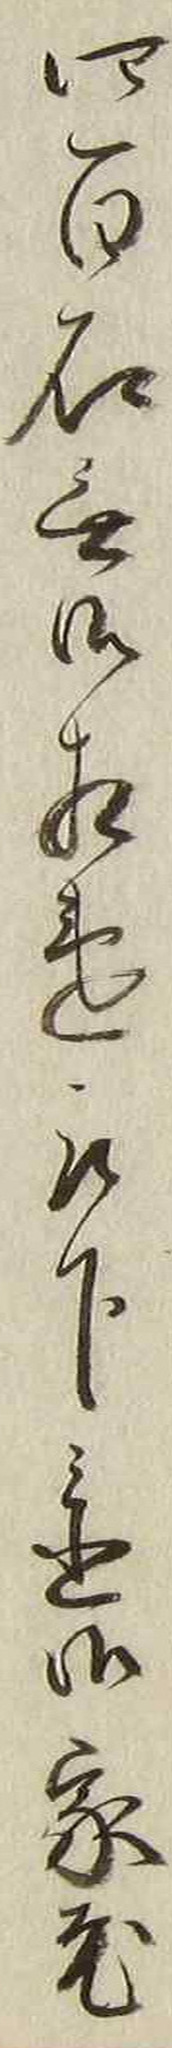四百石無御相違被下置御家老
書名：諸士系譜　巻之18　い之部18
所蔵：会津若松市立会津図書館
